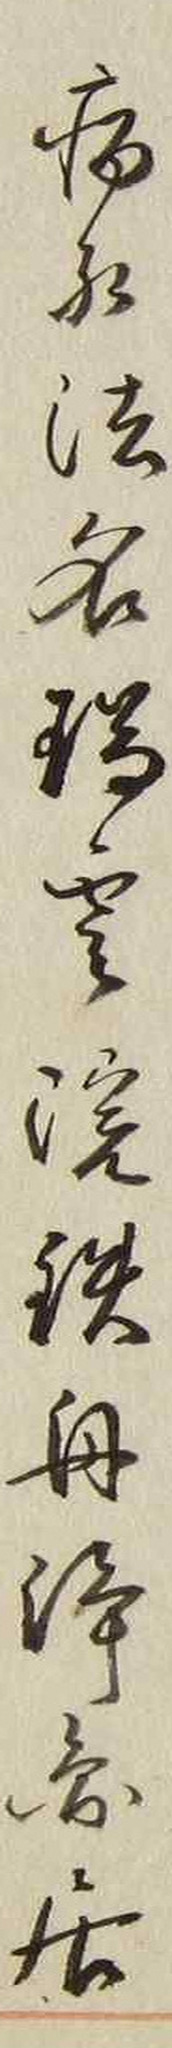病死法名瑞登院鉄舟浄円居
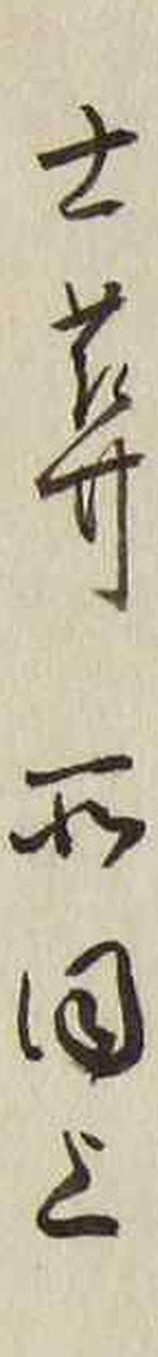士葬所同上

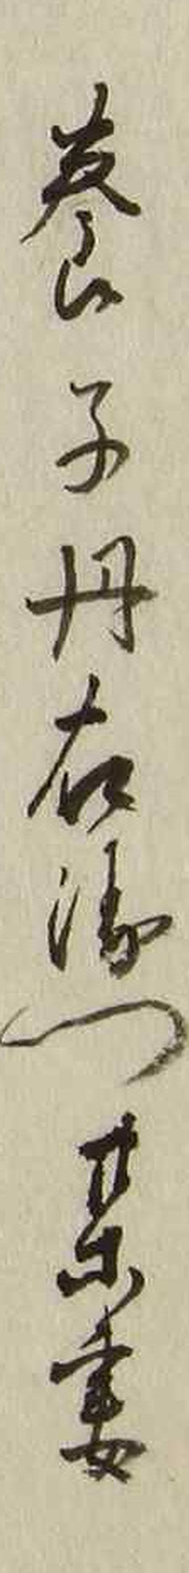女養子丹右衛門某妻
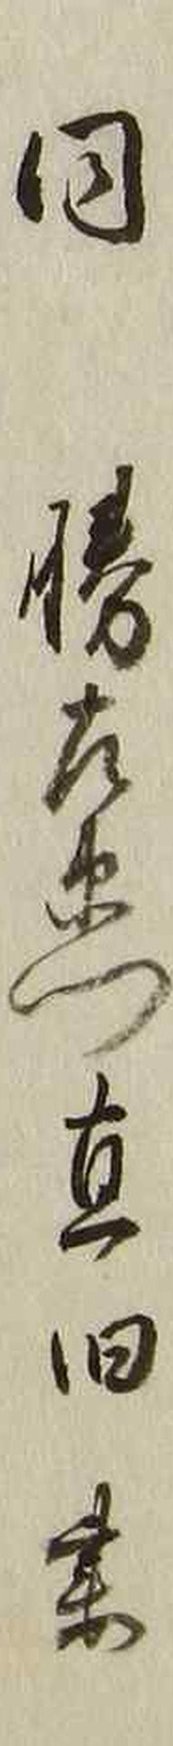同勝左衛門直旧妻
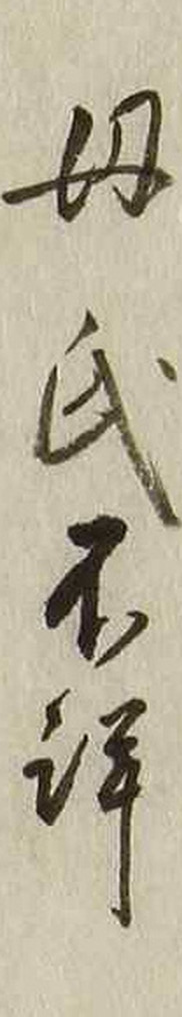母氏不詳
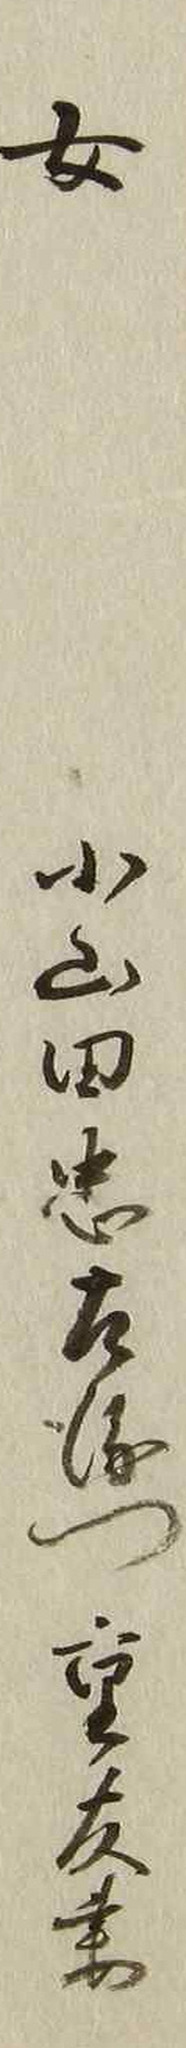女小山田忠左衛門重友妻
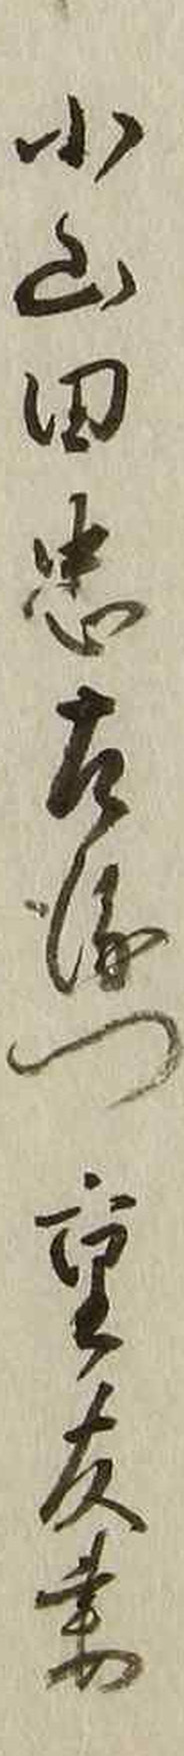女小山田忠左衛門重友妻
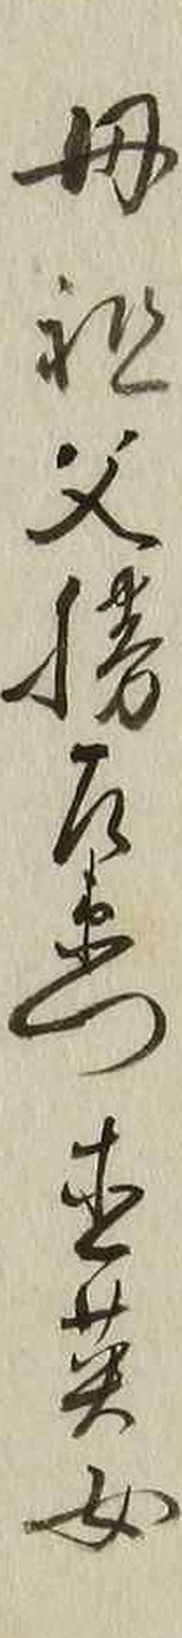母祖父勝左衛門直英女
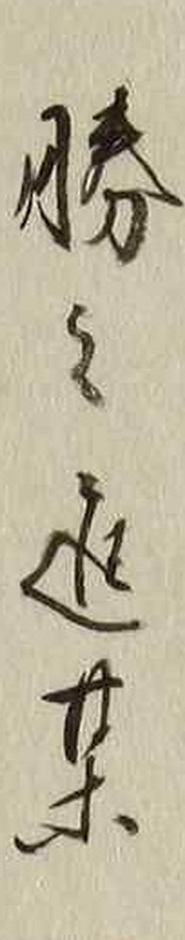勝之進某
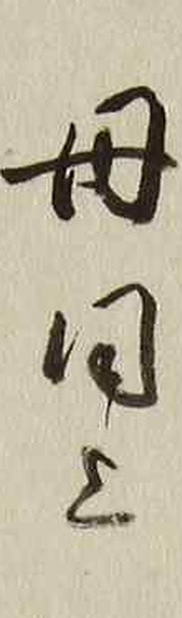母同上
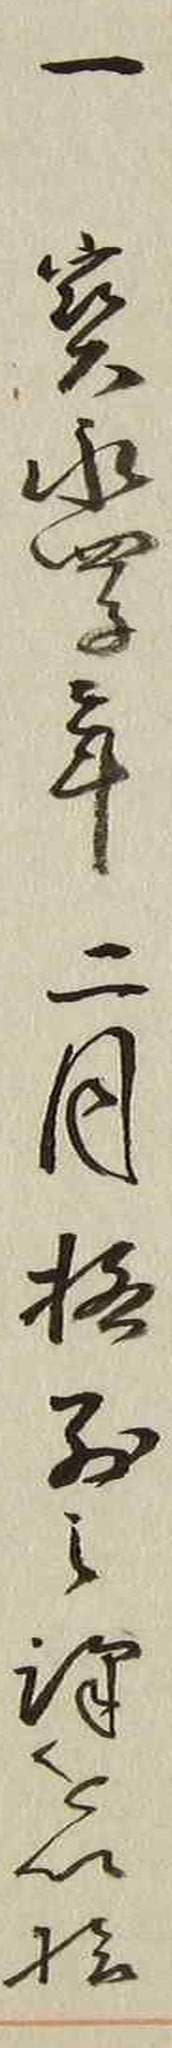一宝永四子年二月格別之譯を以拾
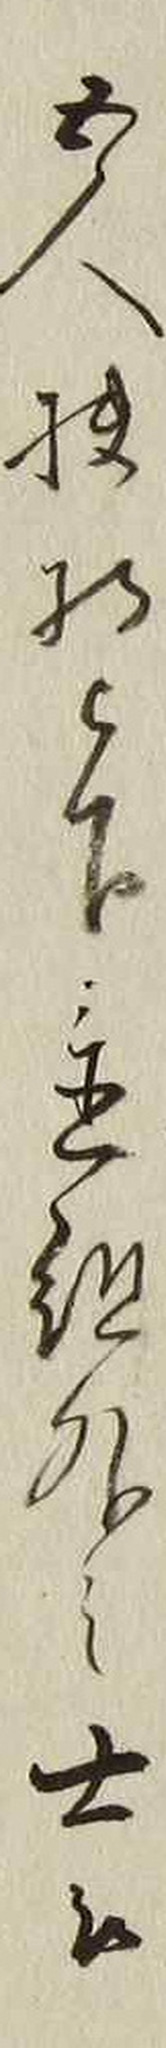五人扶知被下置組外之士被
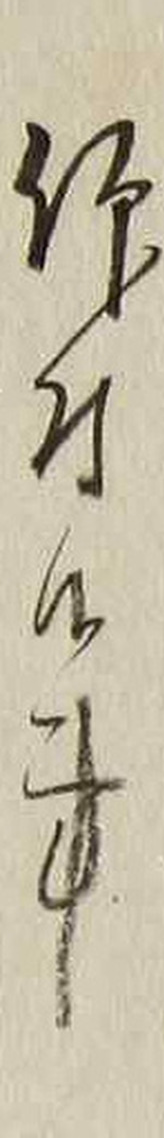仰付候事
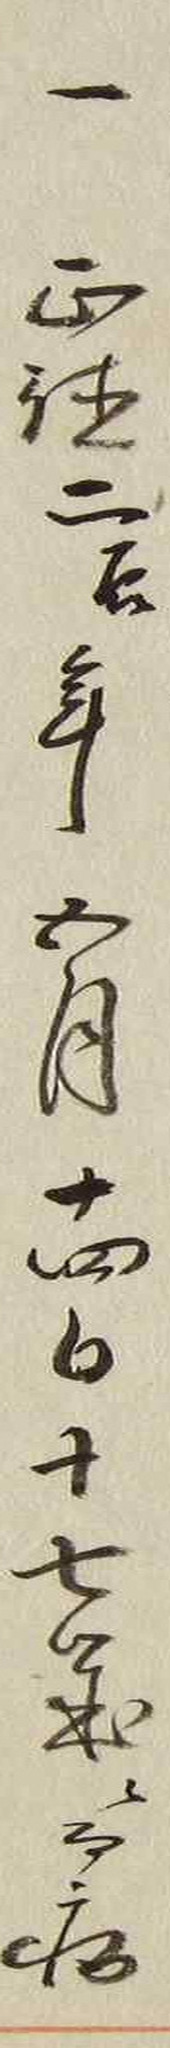一正徳二辰年五月十四日十七歳に而病
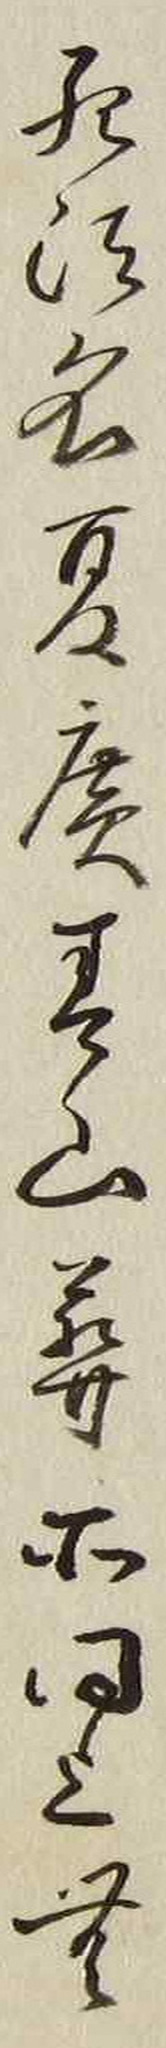死法名夏侯青山葬所同上
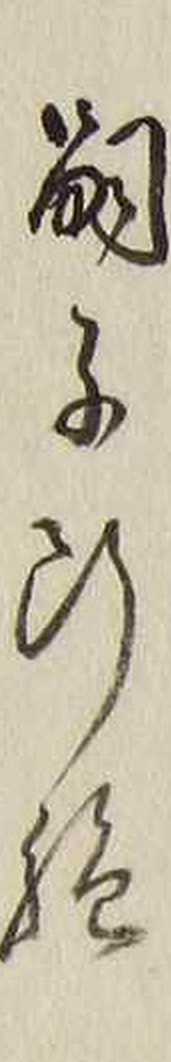嗣子断絶
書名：諸士系譜　巻之159　な之部1
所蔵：会津若松市立会津図書館
